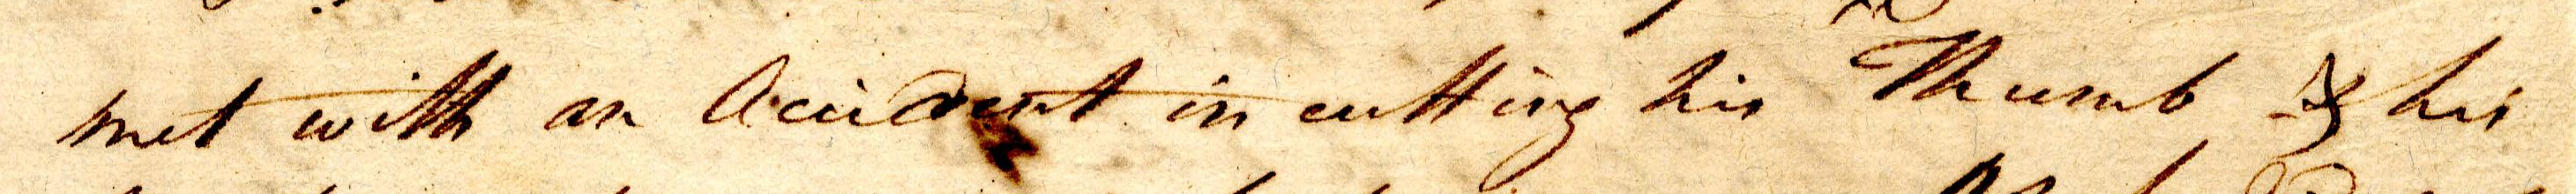met with an Accident in cutting his Thumb & his
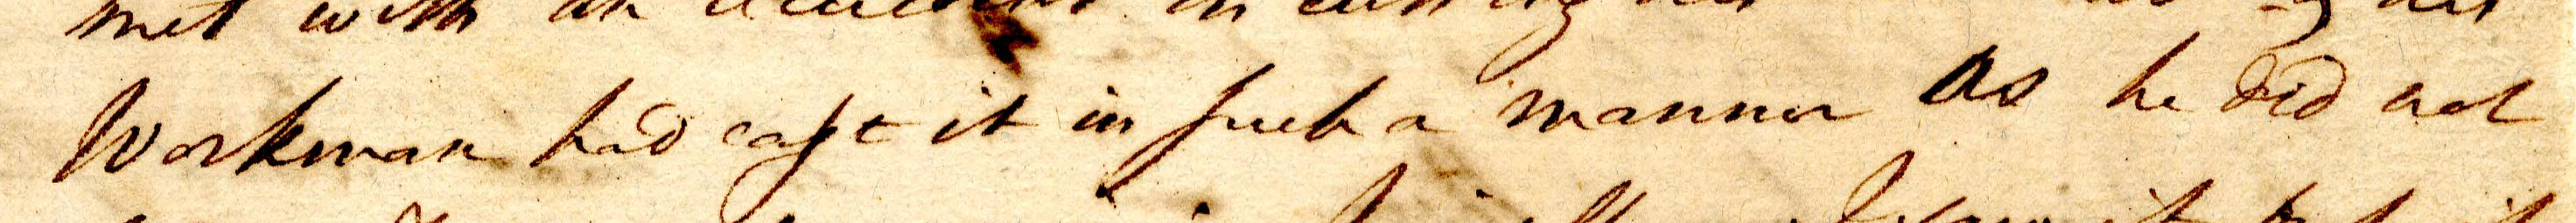Workman had cast it in such a manner as he did not
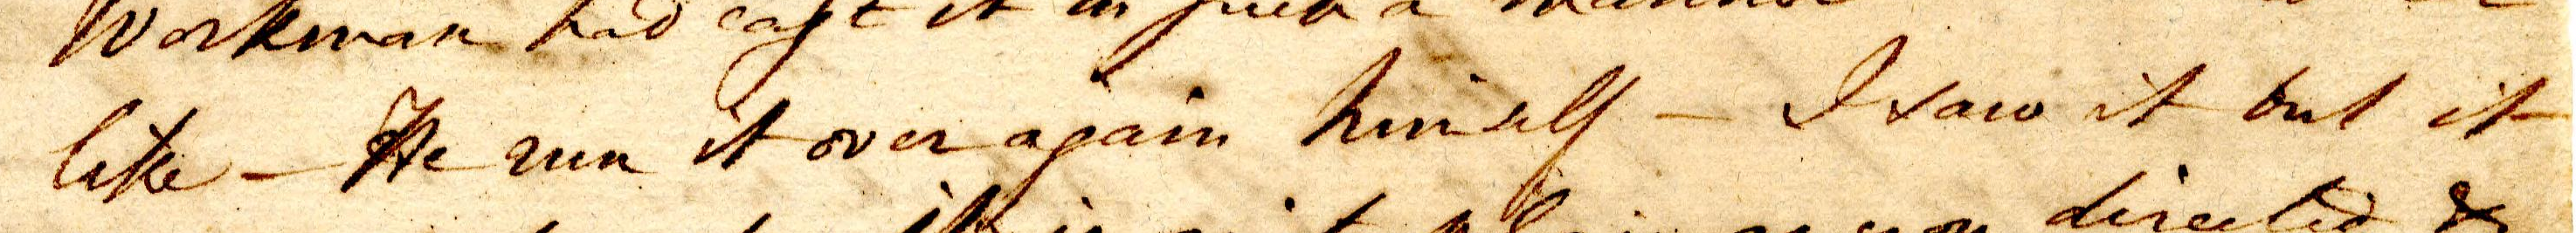life. He run it over again himself. I saw it but it
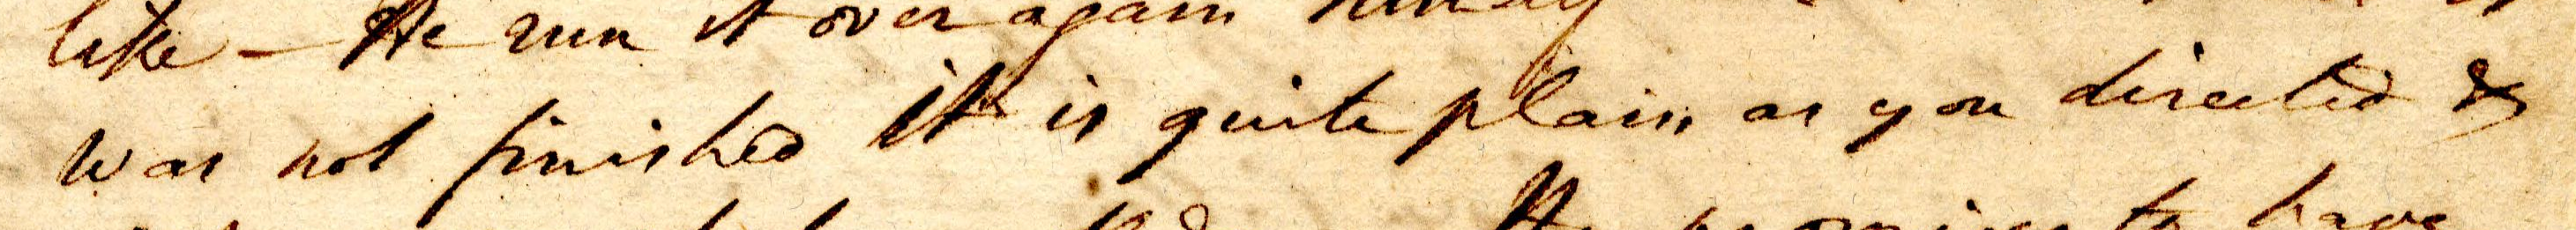was not finished lt is quite plain as you directed &
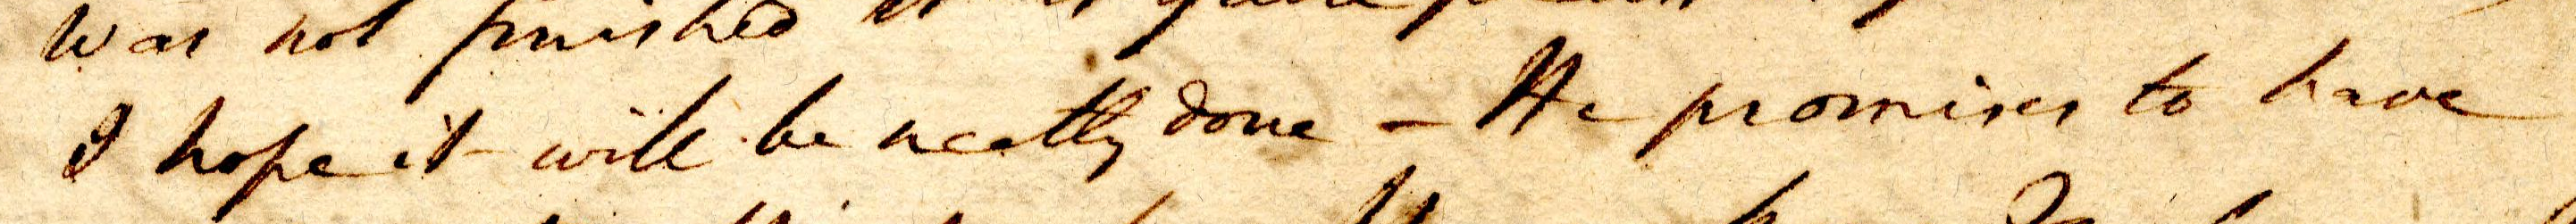I hope it will be neatly done. He promises to have
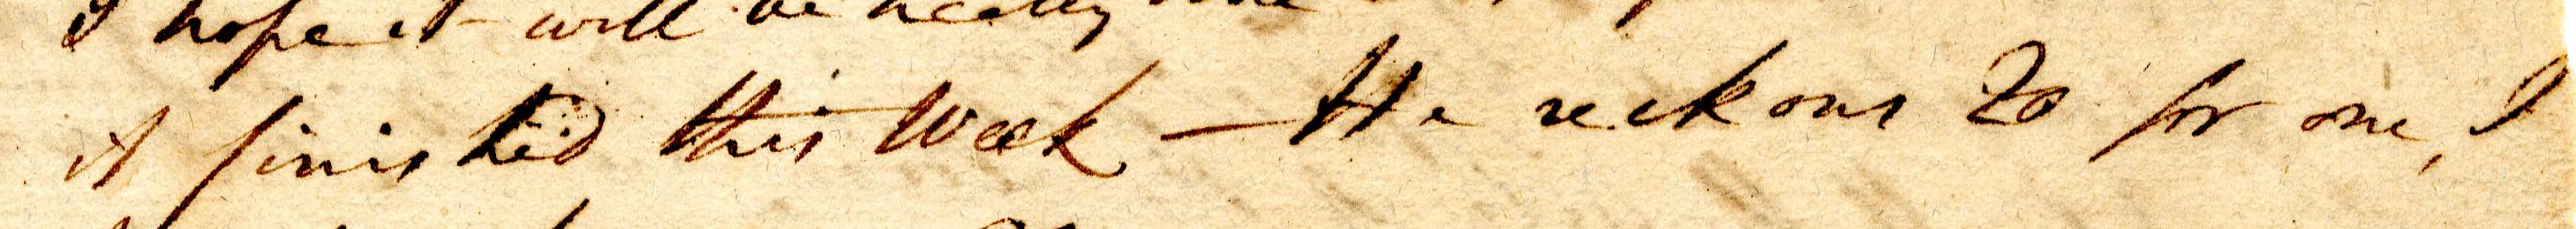it finished this week. He reckons 20 for one, I
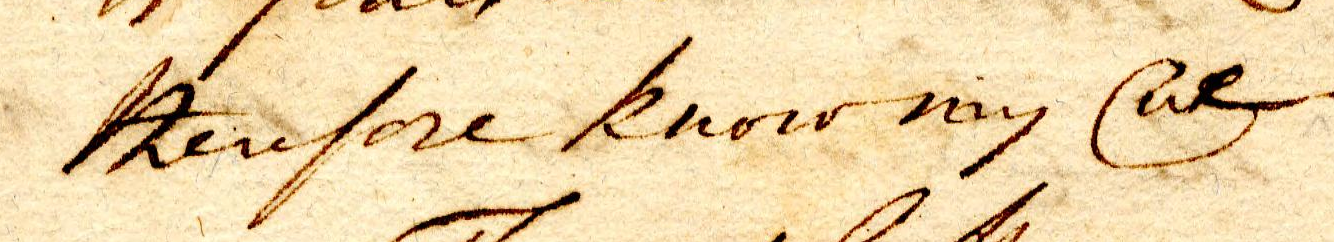therefore know my Cue
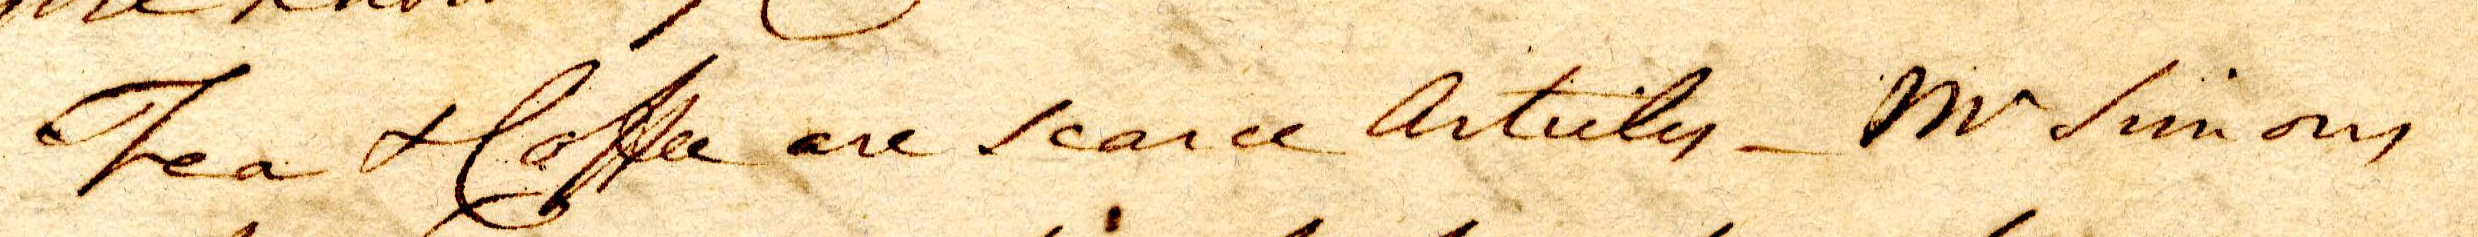Tea & Coffee are scarce Articles. M^r Simons
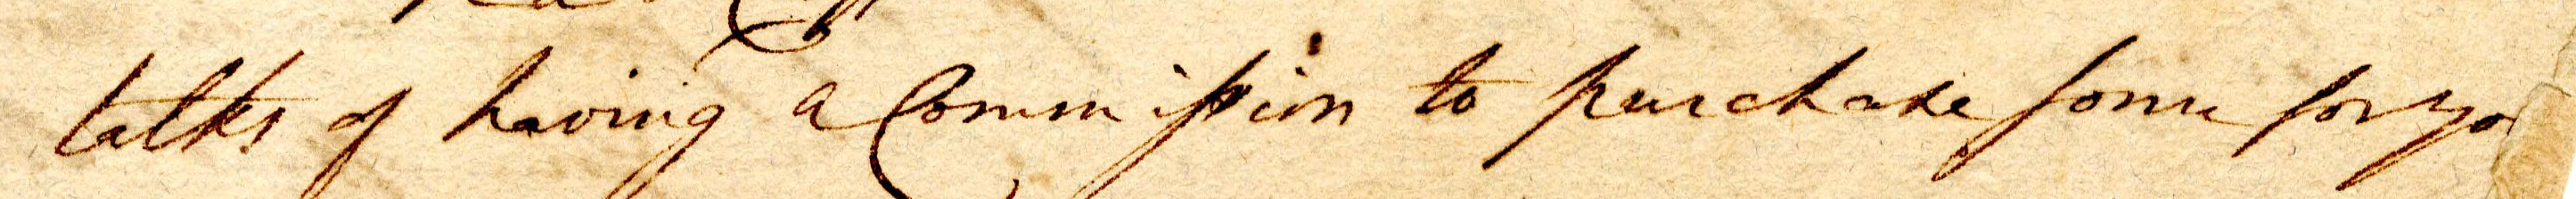talks of having & Commission to purchase some for yo-
